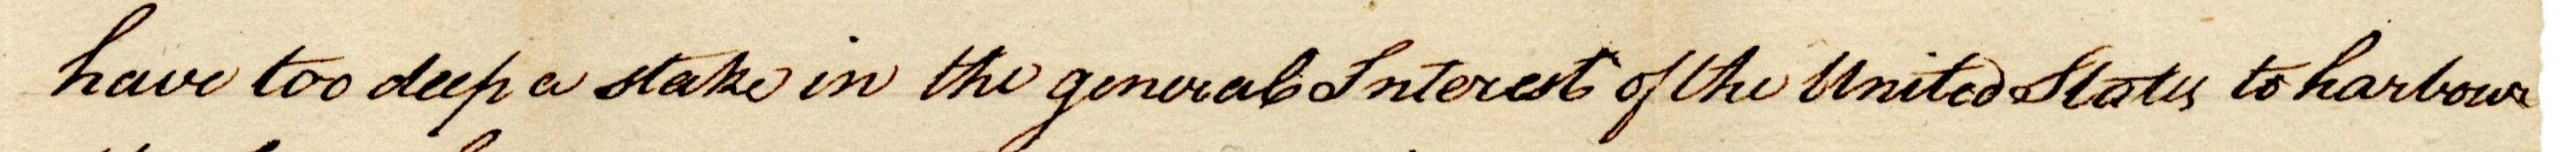have too deep a stake in the general Interest of the United States to harbour
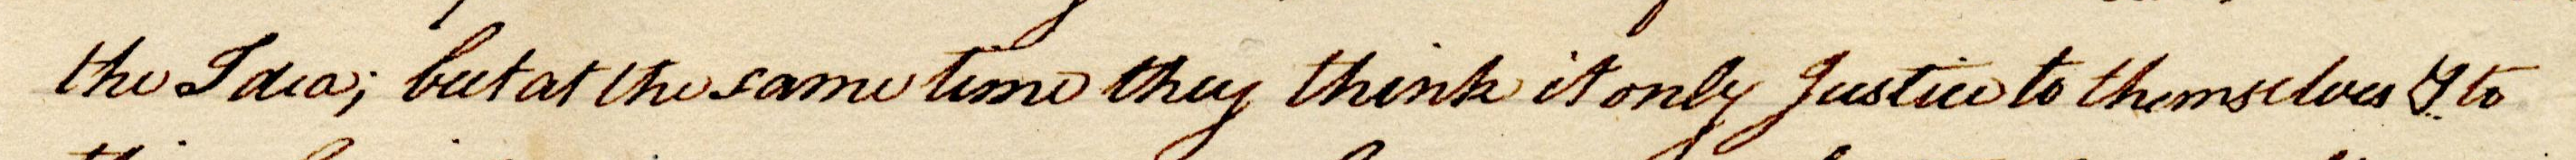the Idea; but at the same time they think it only Justice to themselves & to
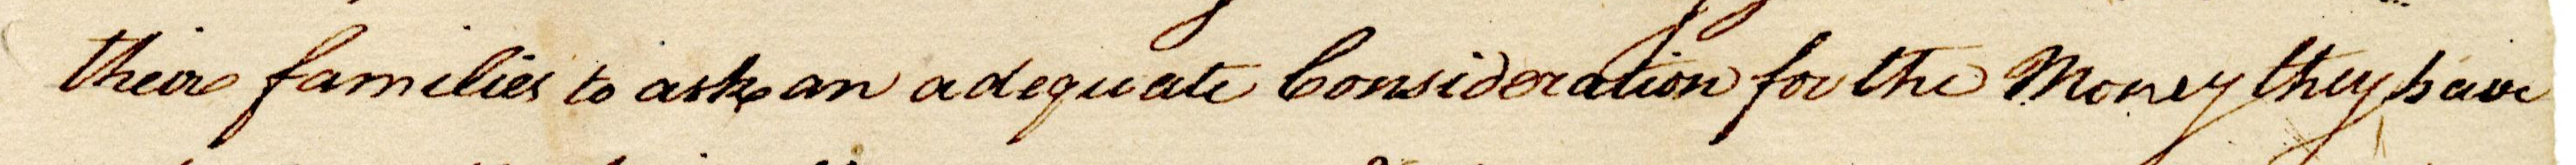their families to ask an adequate Consideration for the Money they have
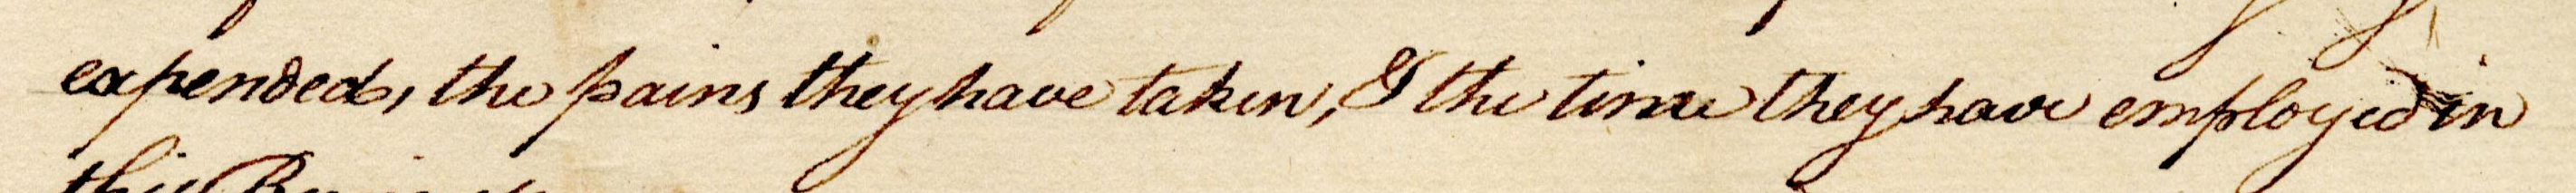expended, the pains they have taken, & the time they have employed in
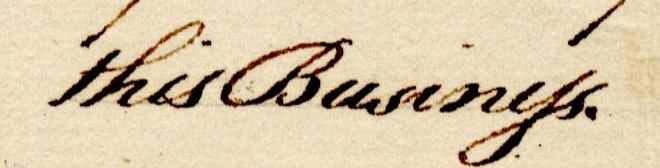this Business
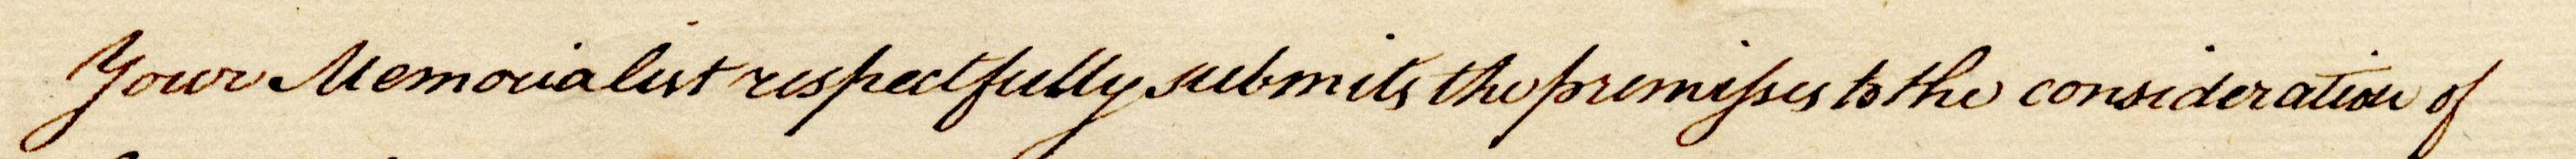Your Memorialist respectfully submits the premises to the consideration of
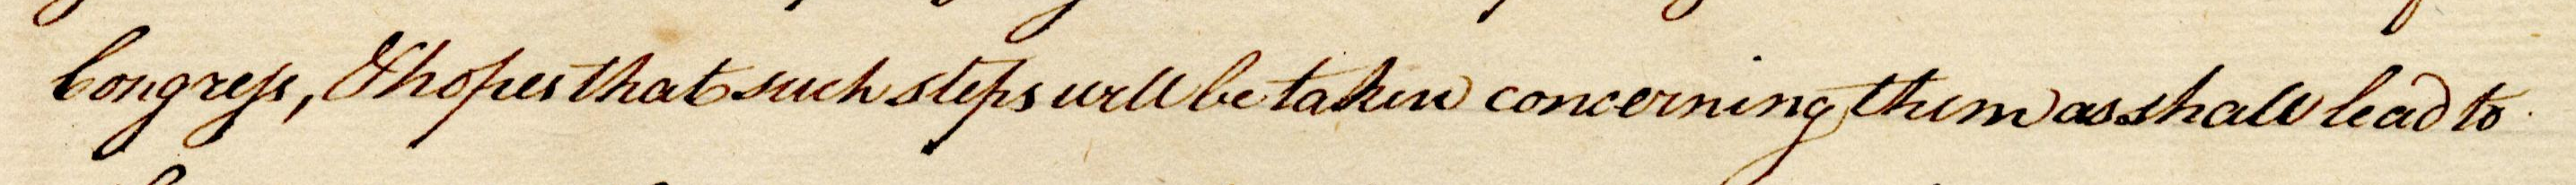Congress, & hopes that such steps will be taken concerning them as shall lead to
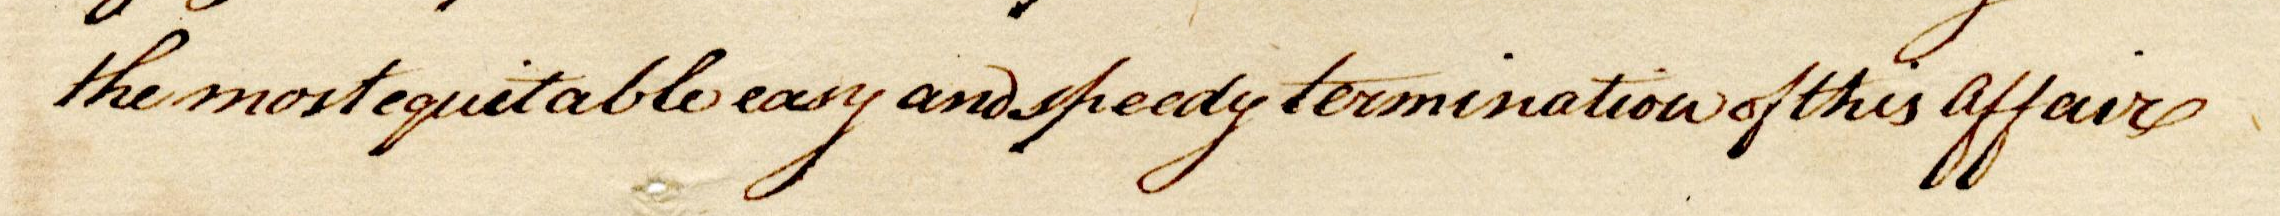the most equitable easy and speedy termination of this affair
